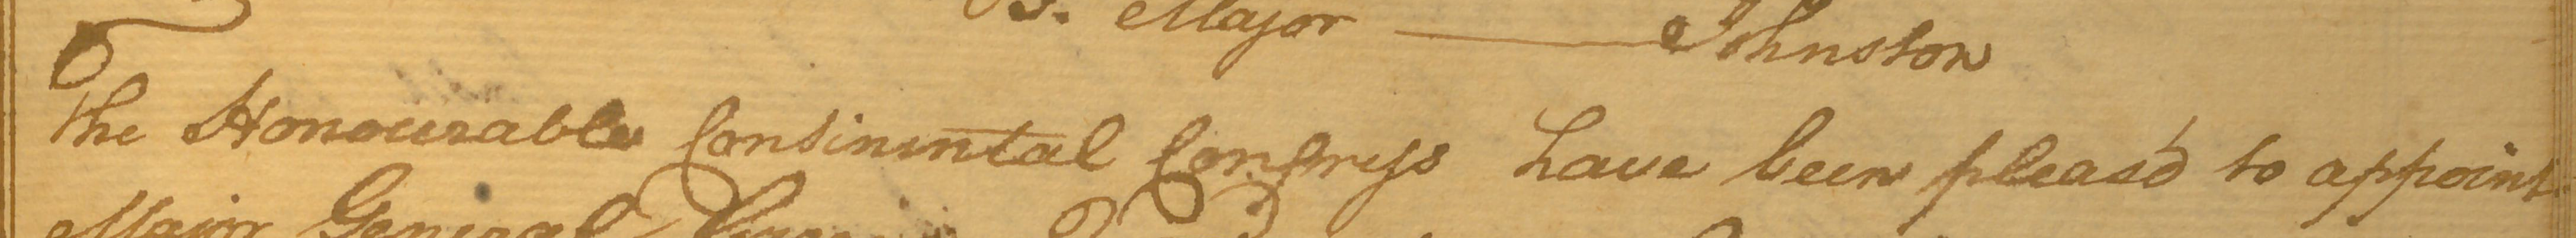The Honourable Continental Congress have been pleas'd to appoint
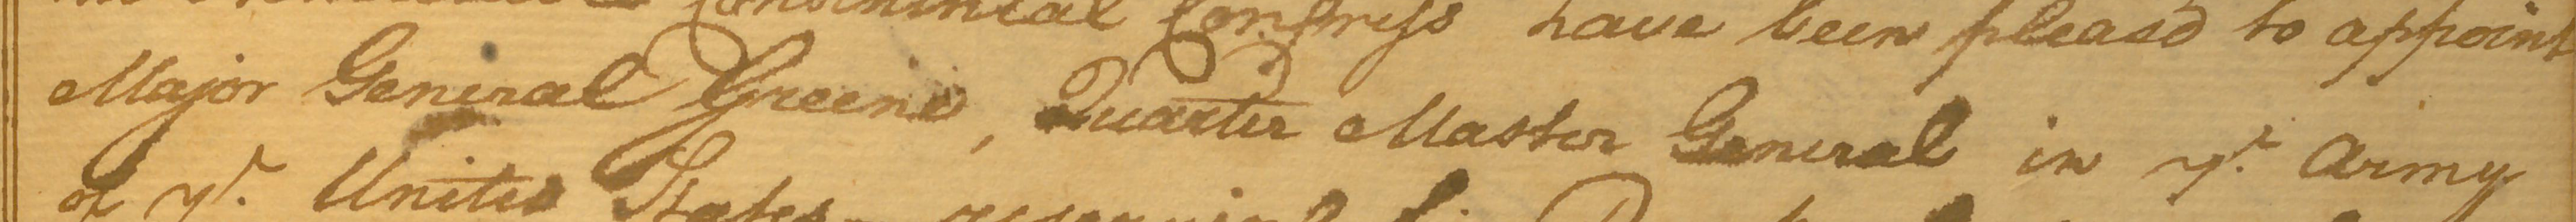Major General Greene, Quarter Master General in y^e. Army
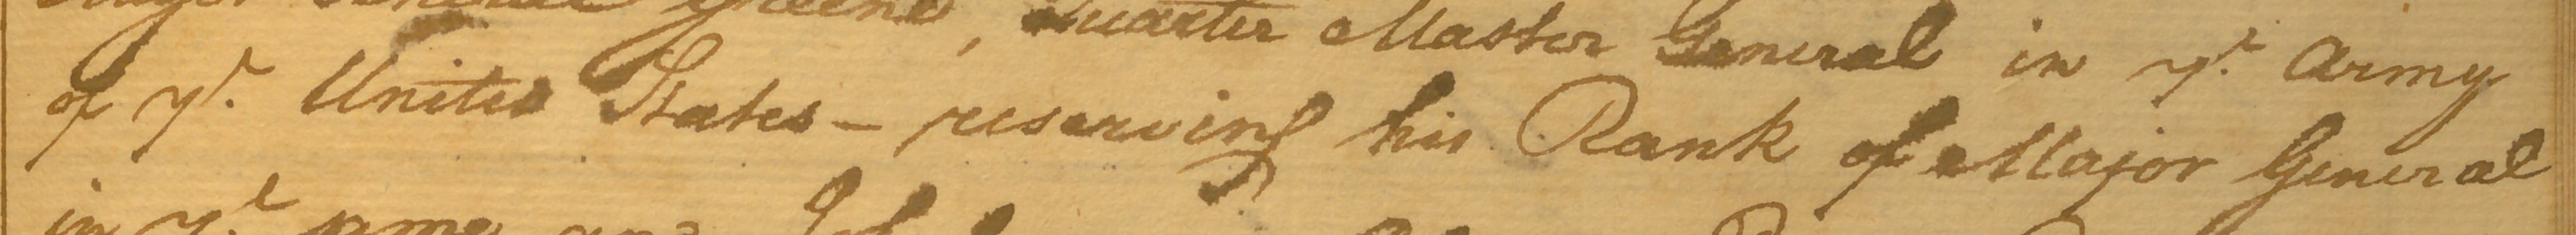of y^e. United States- reserving his Rank of Major General
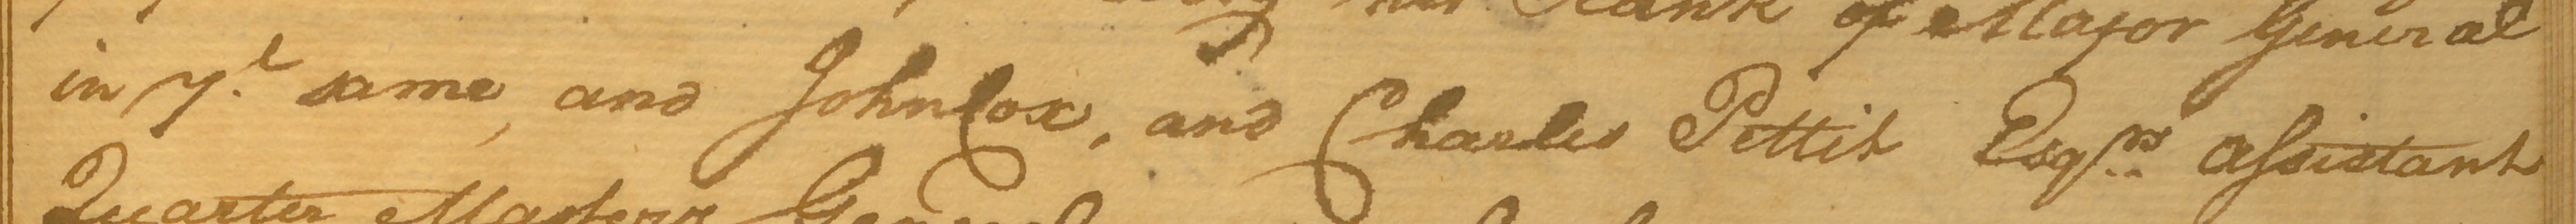in y^e. same, and John Cox, and Charles Pettit Esq^rs. assistant
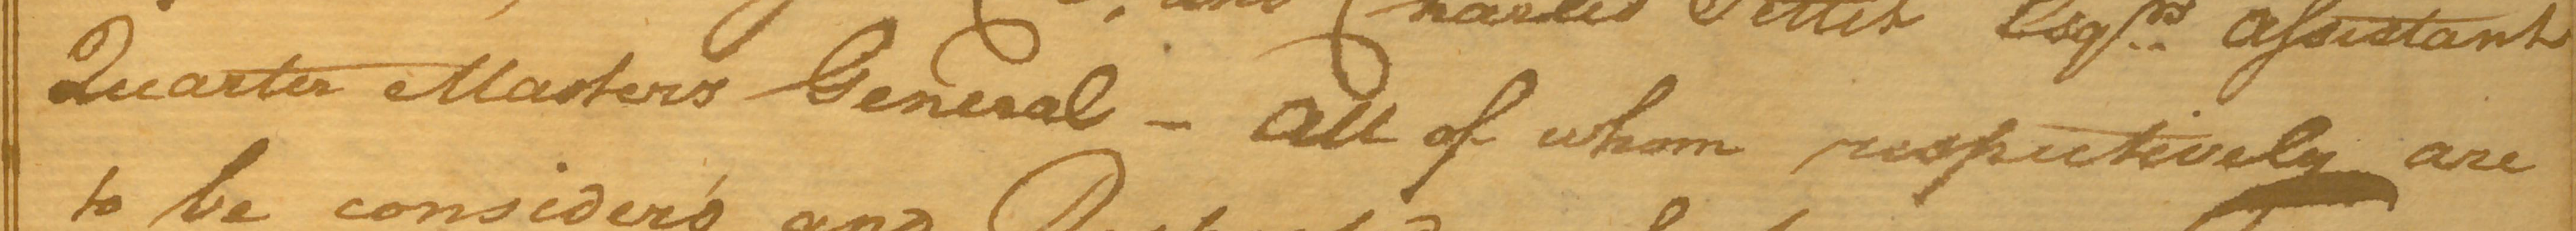Quarter Masters General- All of whom respectively are
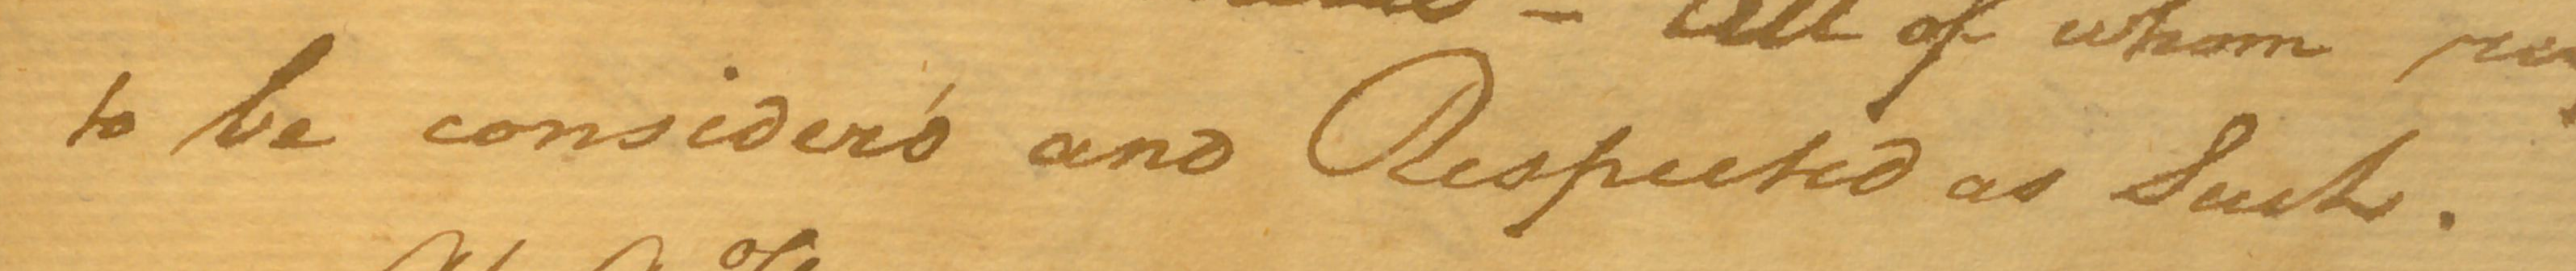to be consider'd and Respected as Such.
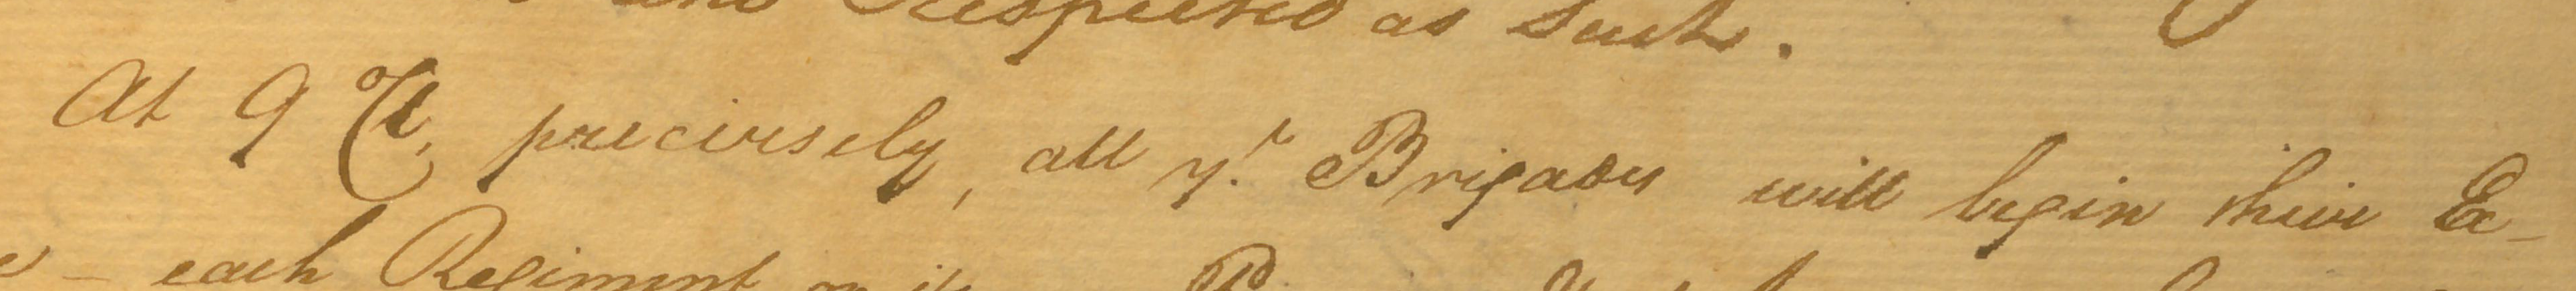At 9 ^oCl. precisely, all y^e. Brigades will begin their Ex-
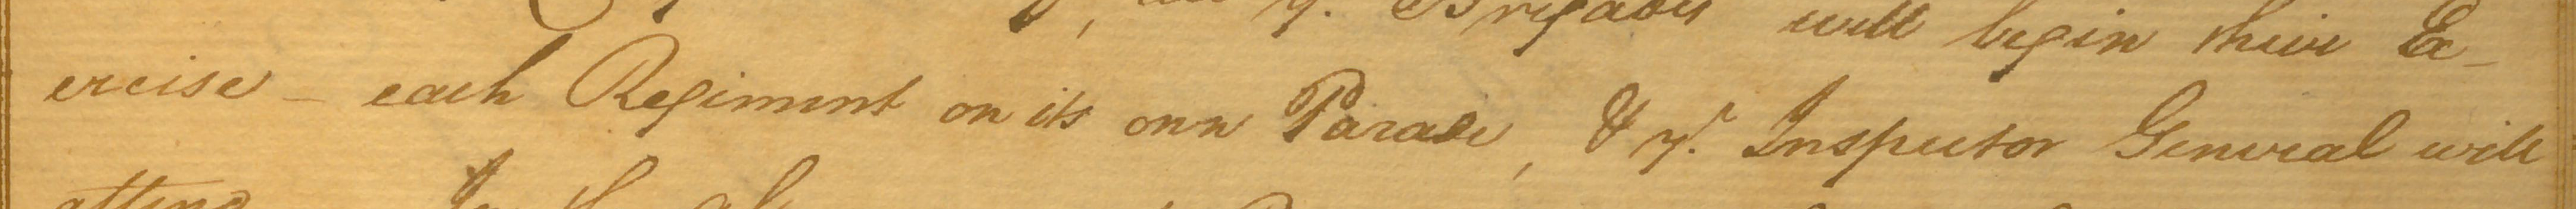ercise- each Regiment on its own Parade, & y^e. Inspector General will
